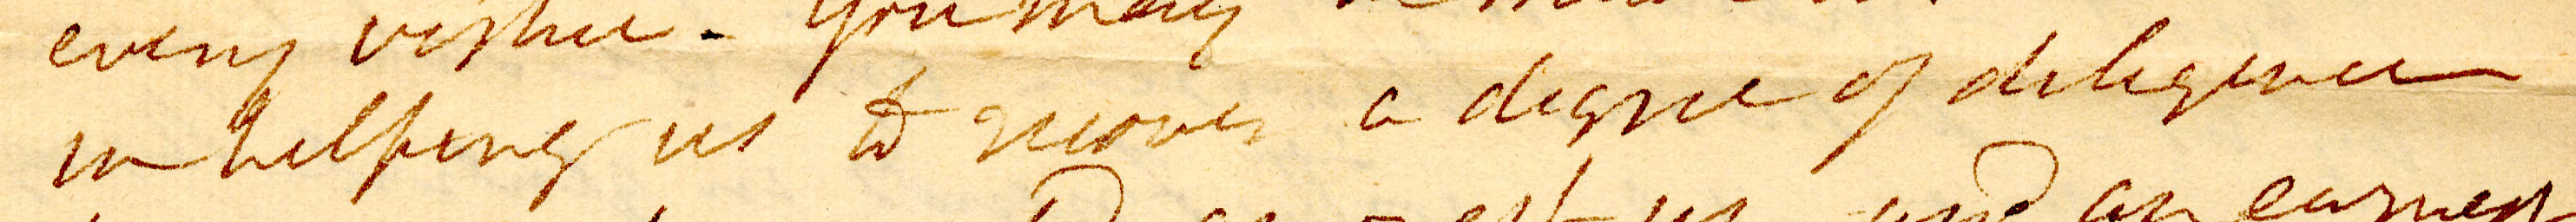in helping us to recover a degree of diligence
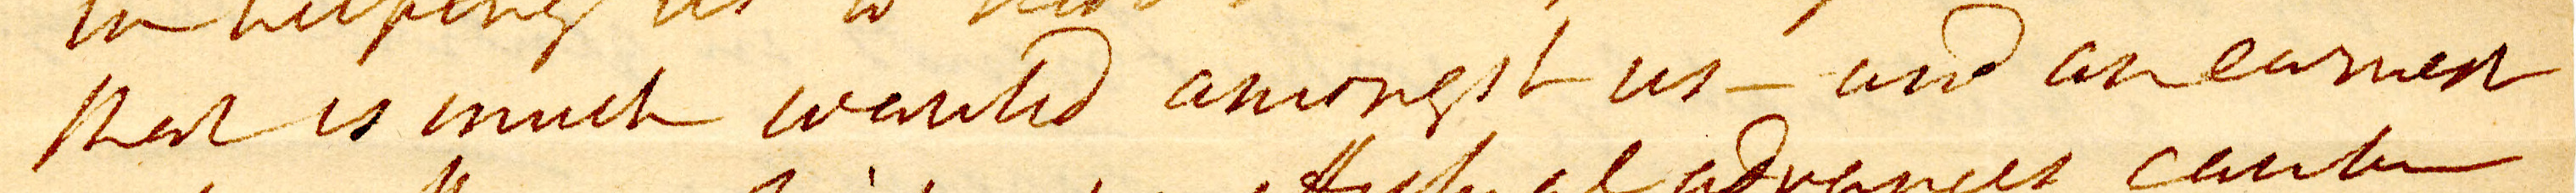that is much wanted amongst us- and an earnest
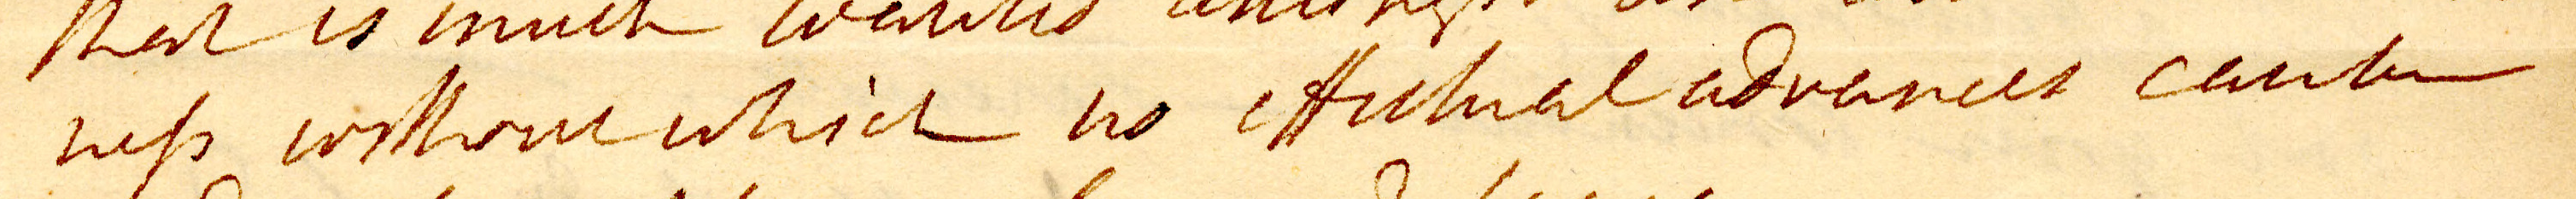ness without which no effectual advances can be
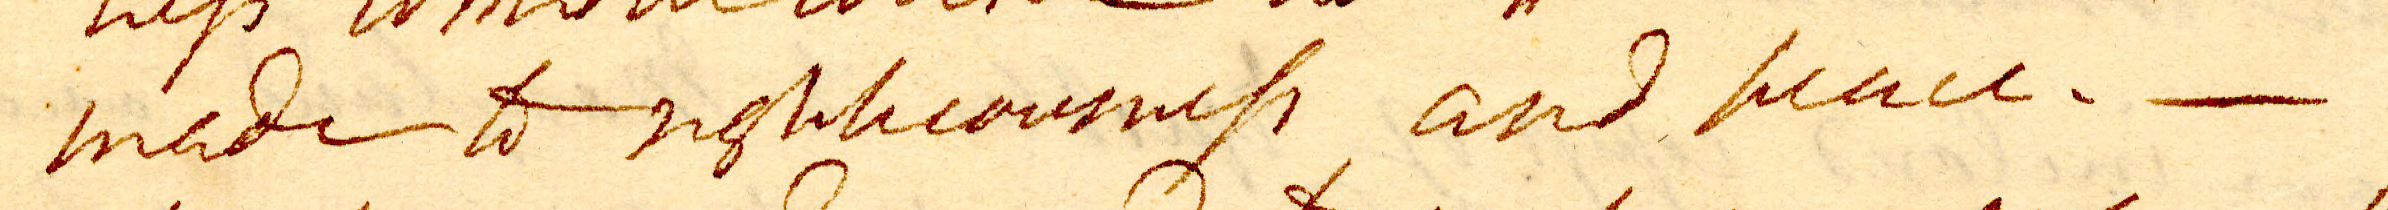made to righteousness and peace.-
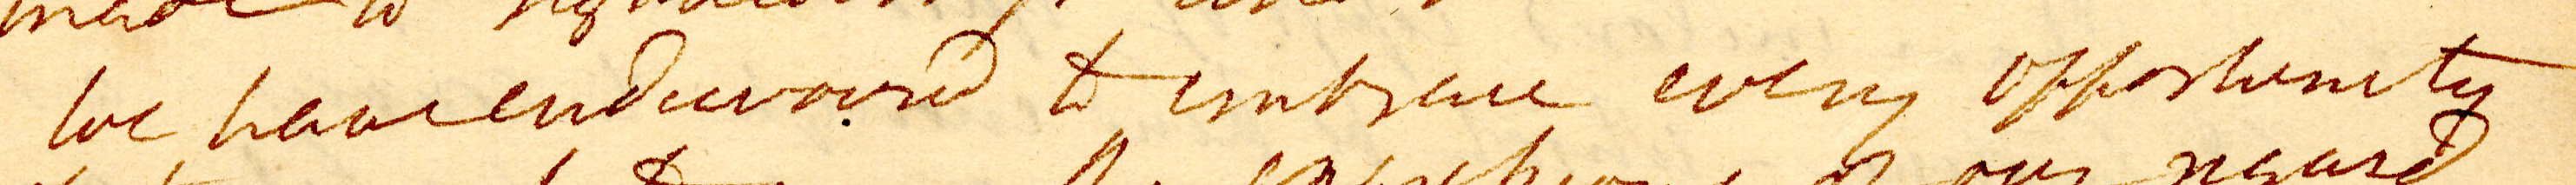We have endeavoured to embrace every opportunity
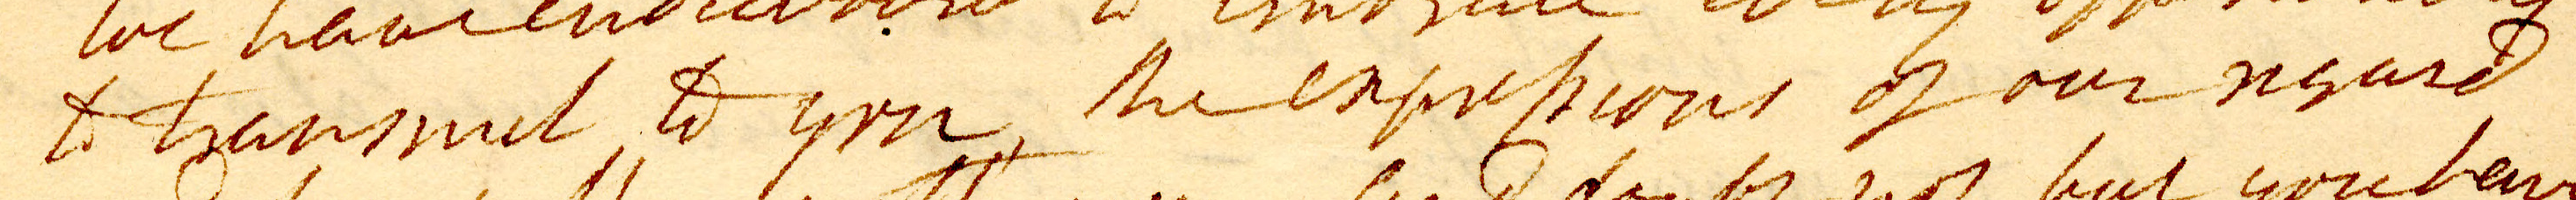to transmit to you the expressions of our regard
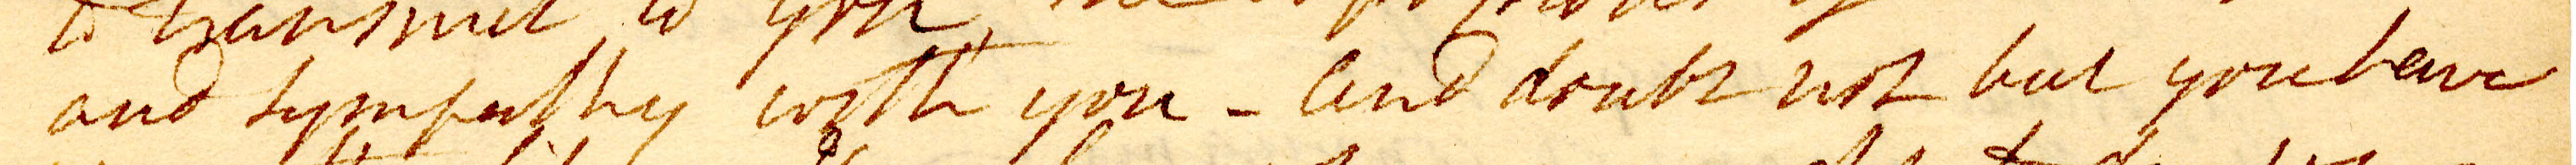and sympathy with you. And doubt not but you have
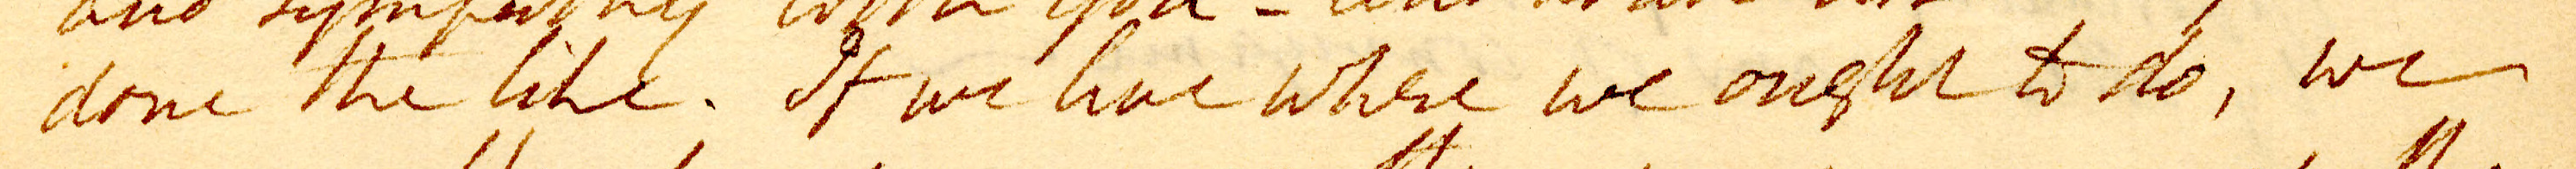done the like. If we live where we ought to do, we
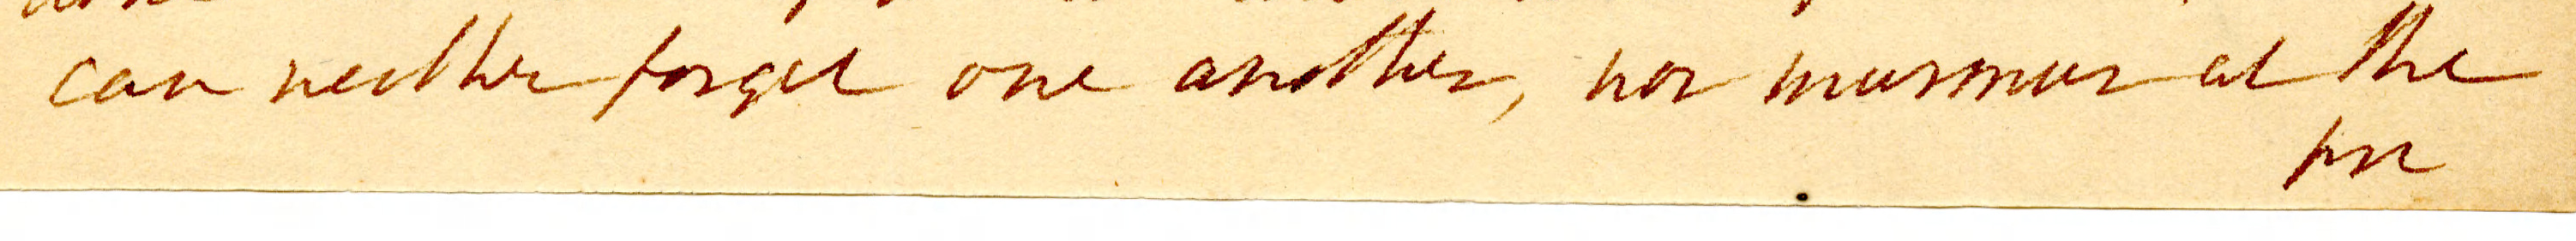can neither forget one another, nor murmur at the
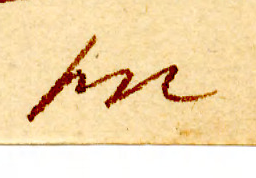pr
